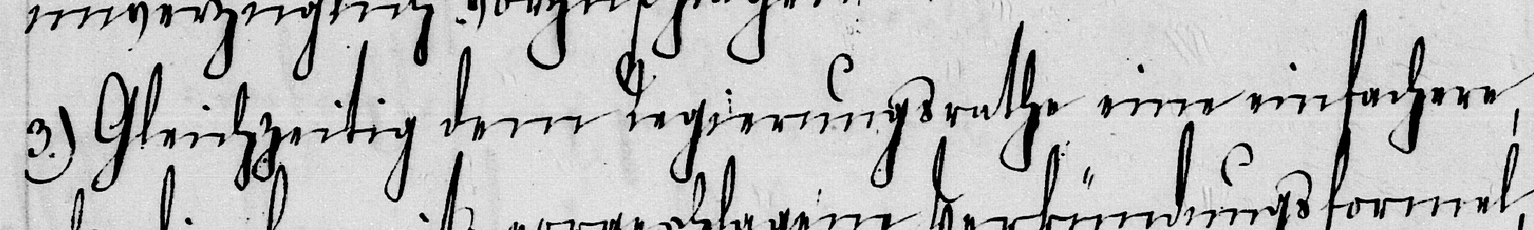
3.) Gleichzeitig dem Regierungsrathe eine einfachere
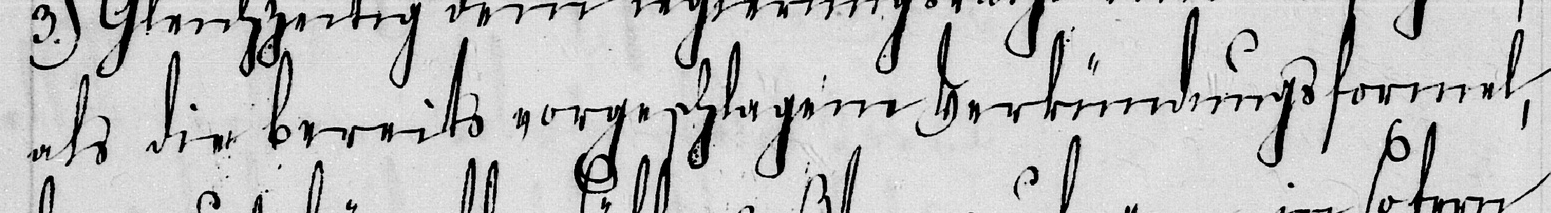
als die bereits vorgeschlagene Verkündungsformel,
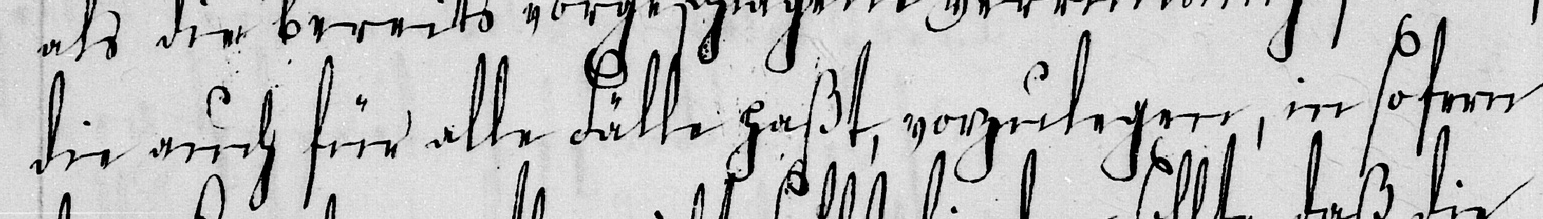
die auch für alle Fälle paßt, vorzulegen, in sofern
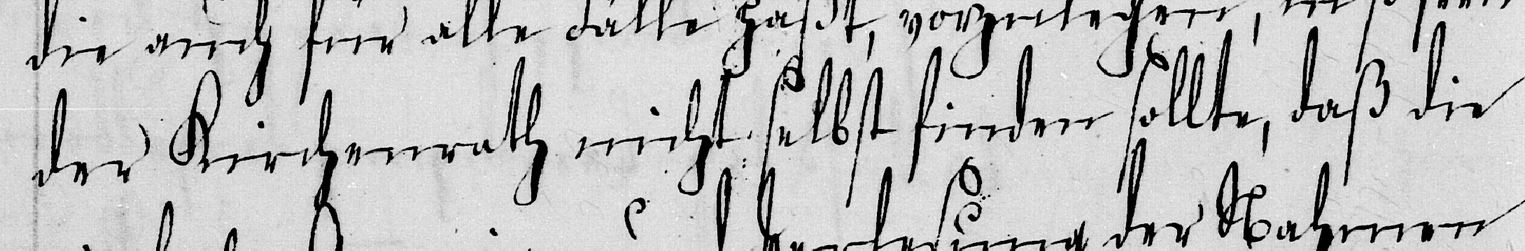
der Kirchenrath nicht selbst finden sollte, daß die
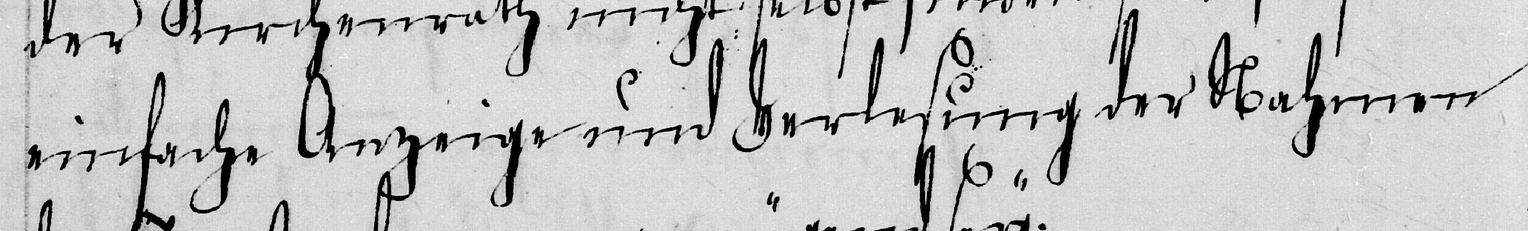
einfache Anzeige und Verlesung der Nahmen
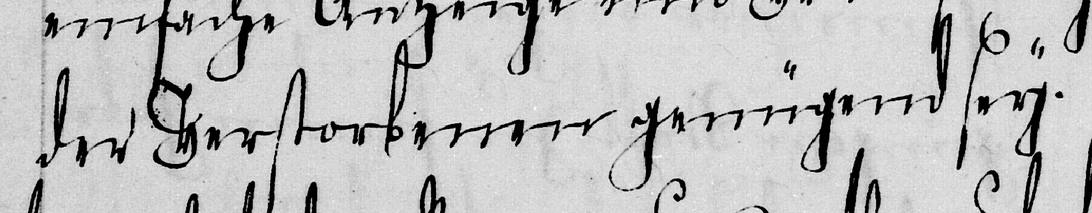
der Verstorbenen genügend sey.
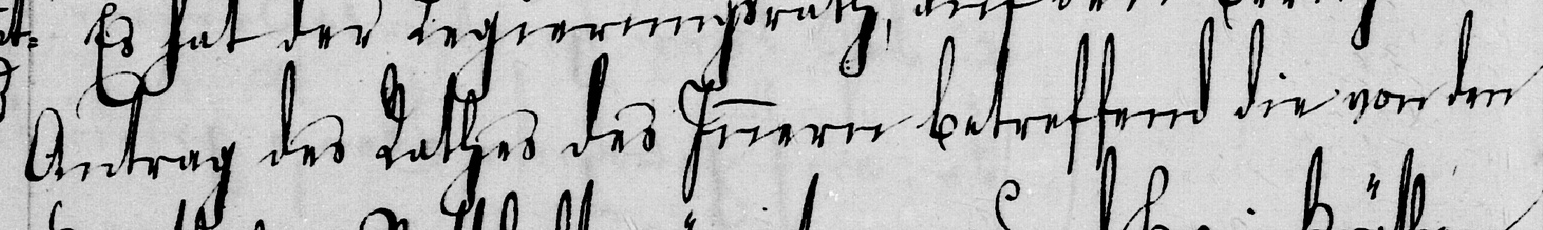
Antrag des Rathes des Innern betreffend die von den
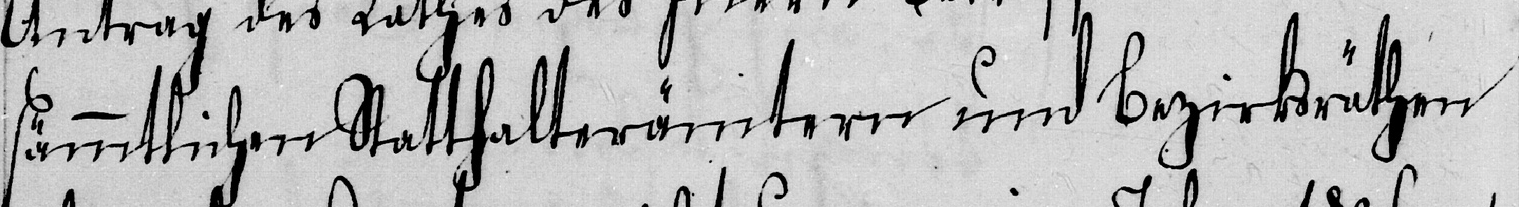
sämmtlichen Statthalterämtern und Bezirksräthen
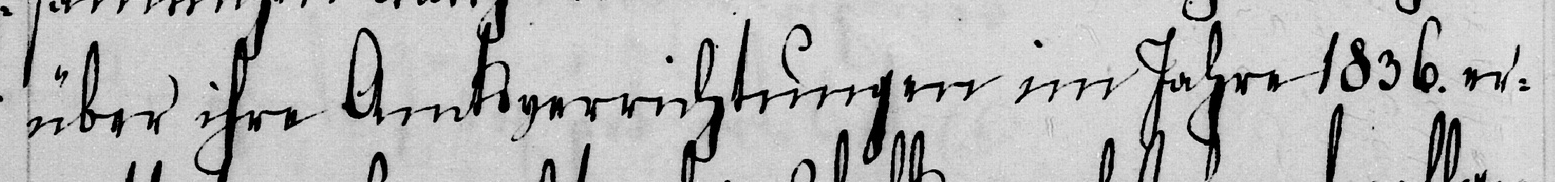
über ihre Amtsverrichtungen im Jahre 1836. er¬
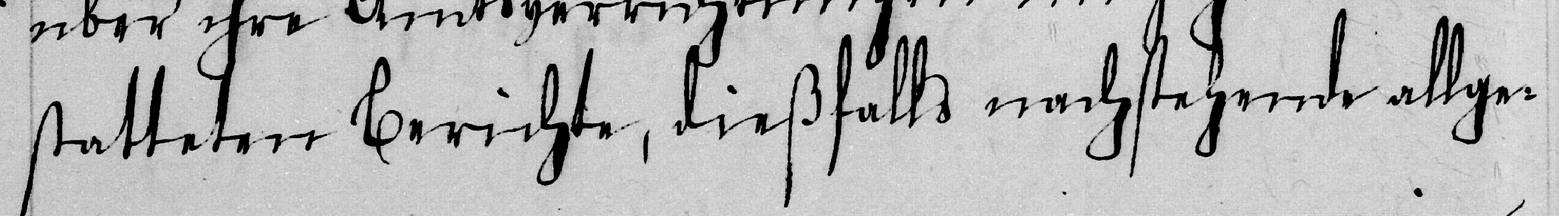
statteten Berichte, dießfalls nachstehende allge-
